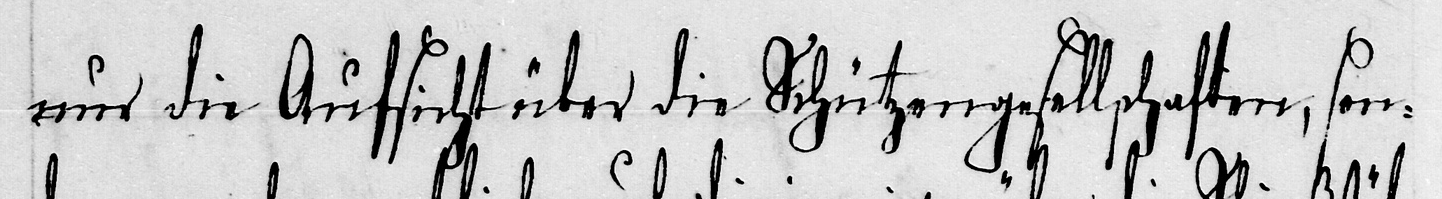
nur die Aufsicht über die Schützengesellschaften,
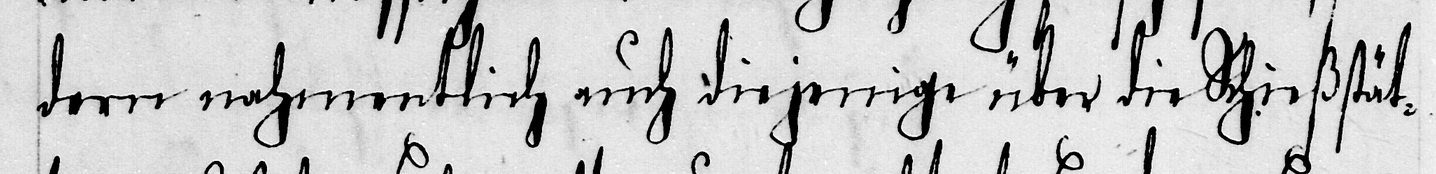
dern nahmentlich auch diejenige über die Schießstät¬
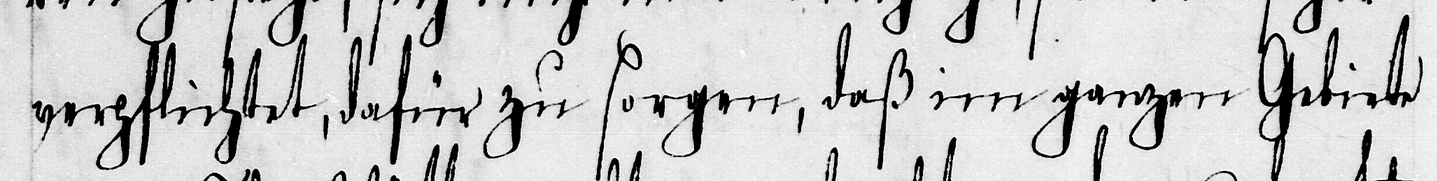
verpflichtet, dafür zu sorgen, daß im ganzen Gebiete
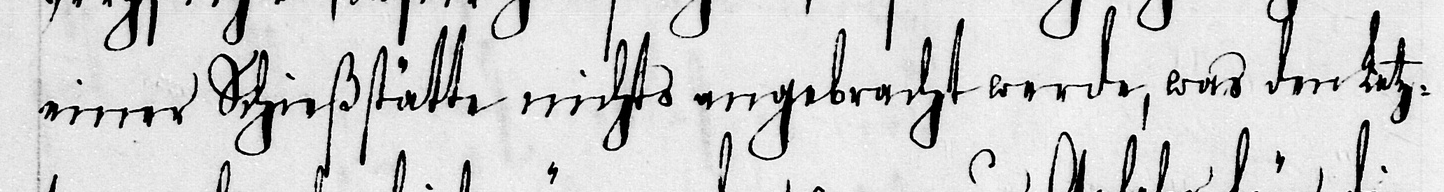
eines Schießstätte nichts angebracht werde, was den Letz¬
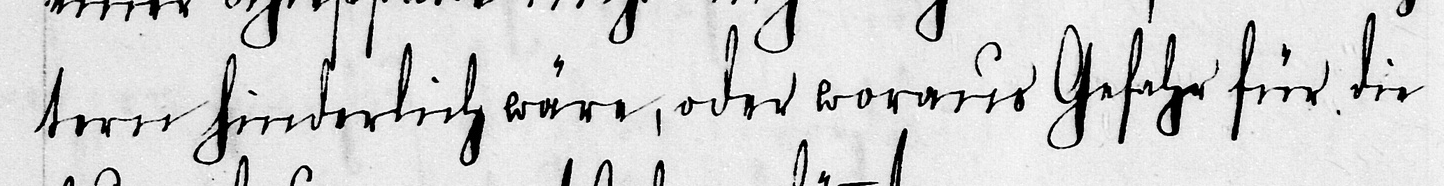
tern hinderlich wäre, oder woraus Gefahr für die
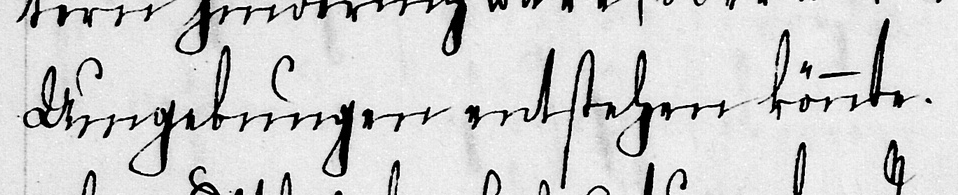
Umgebungen entstehen könnte.
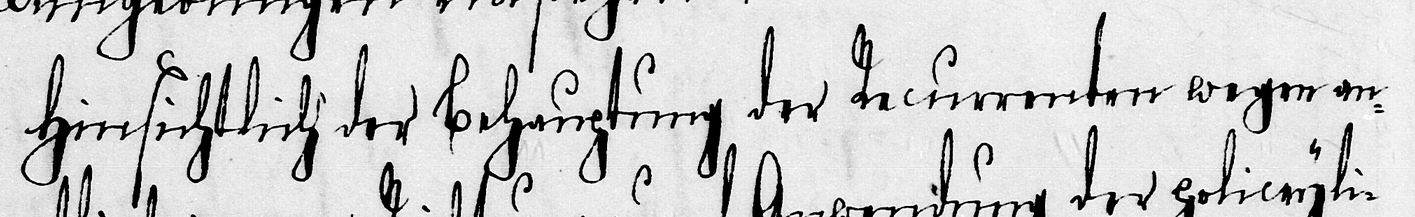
Hinsichtlich der Behauptung der Recurrenten wegen an¬
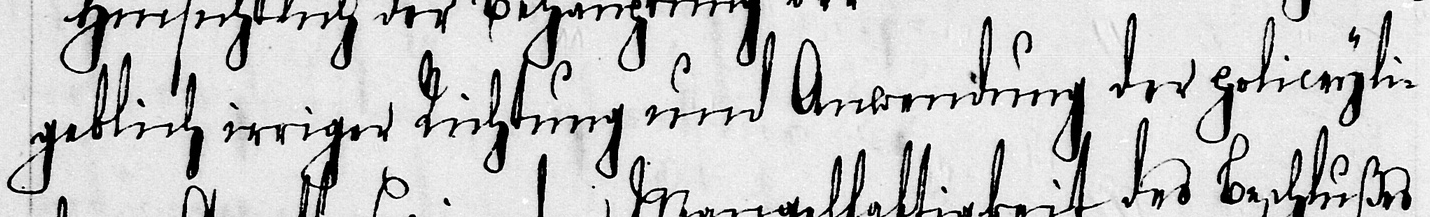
geblich irriger Richtung und Anwendung der policeyli¬
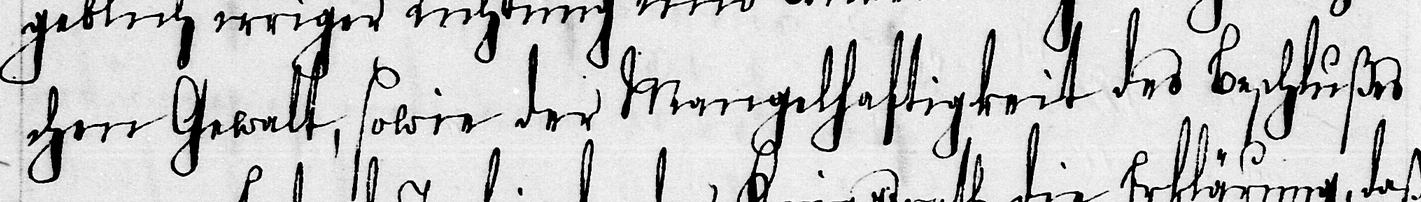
chen Gewalt, sowie der Mangelhaftigkeit des Beschlußes
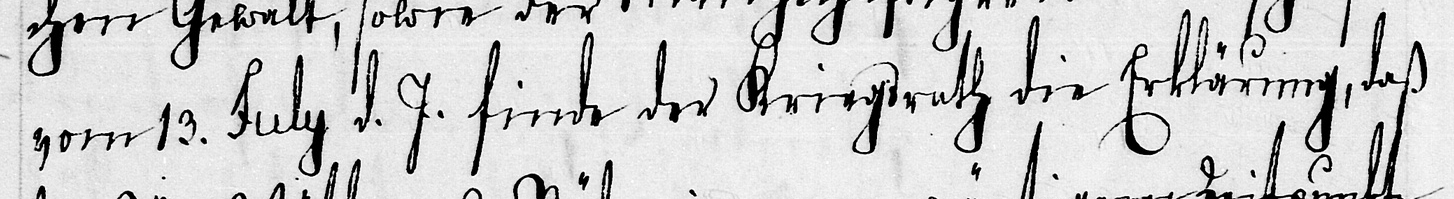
vom 13. July d. J. finde der Kriegsrath die Erklärung, daß
